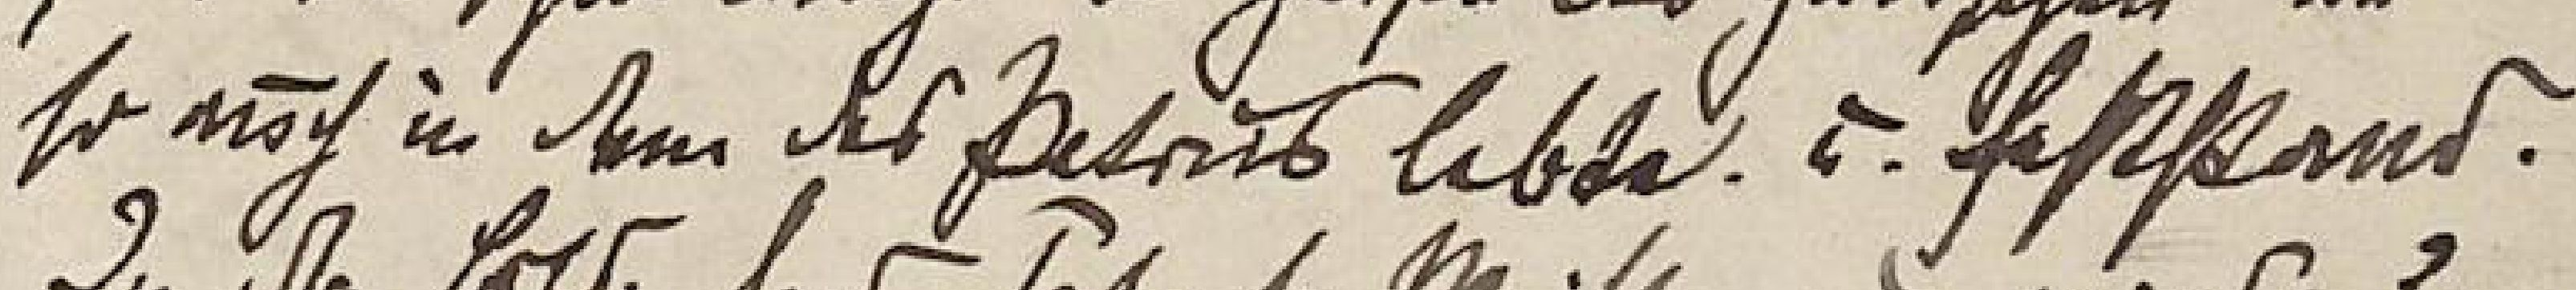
so auch in dem des Petrus lebte u. feststand.
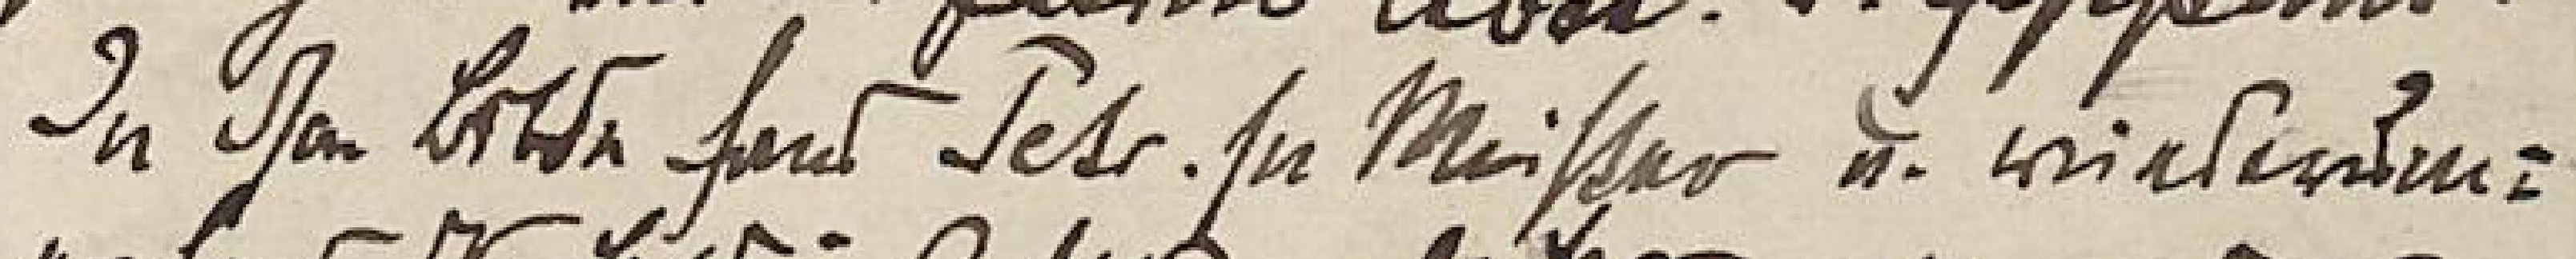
Im dsm Bilde fand Petr. sn Meister u. wiederum:
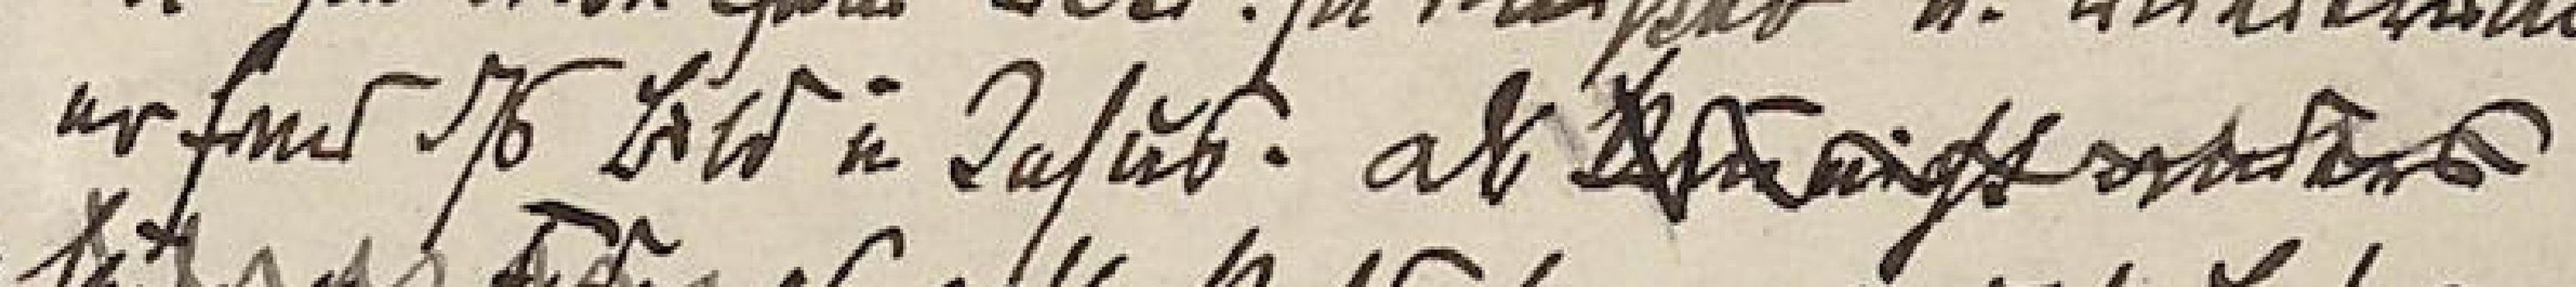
er fand dss Bild in Jesus. Da kan nicht anders
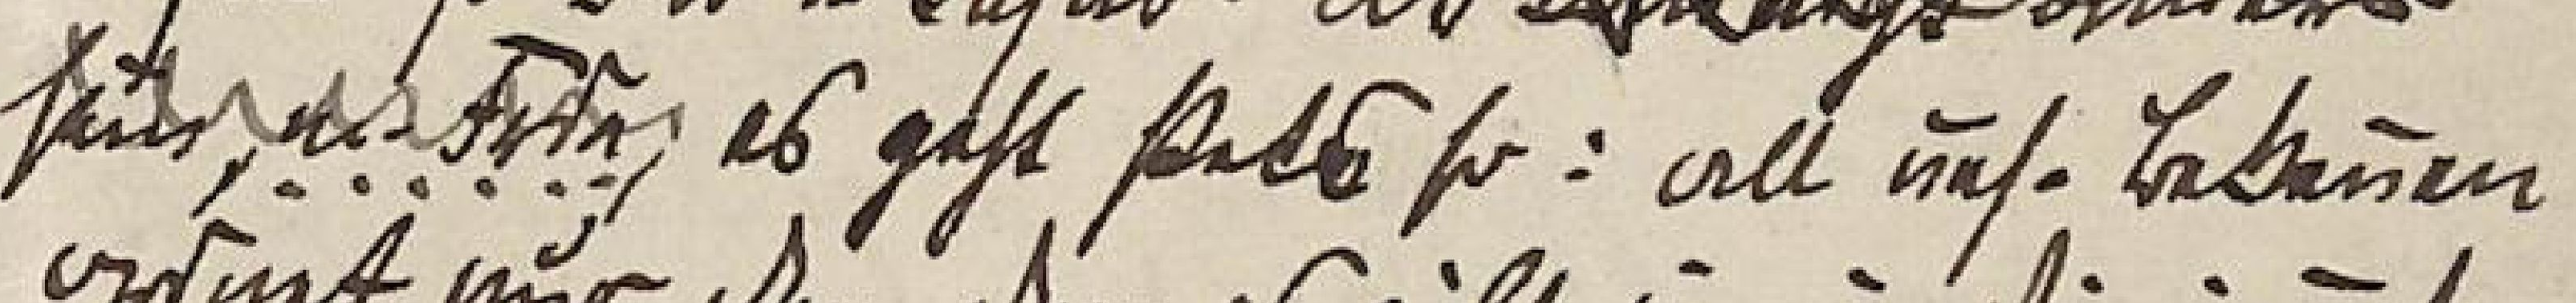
sein, m. Frde, es geht stets so: all uns. Bekenen
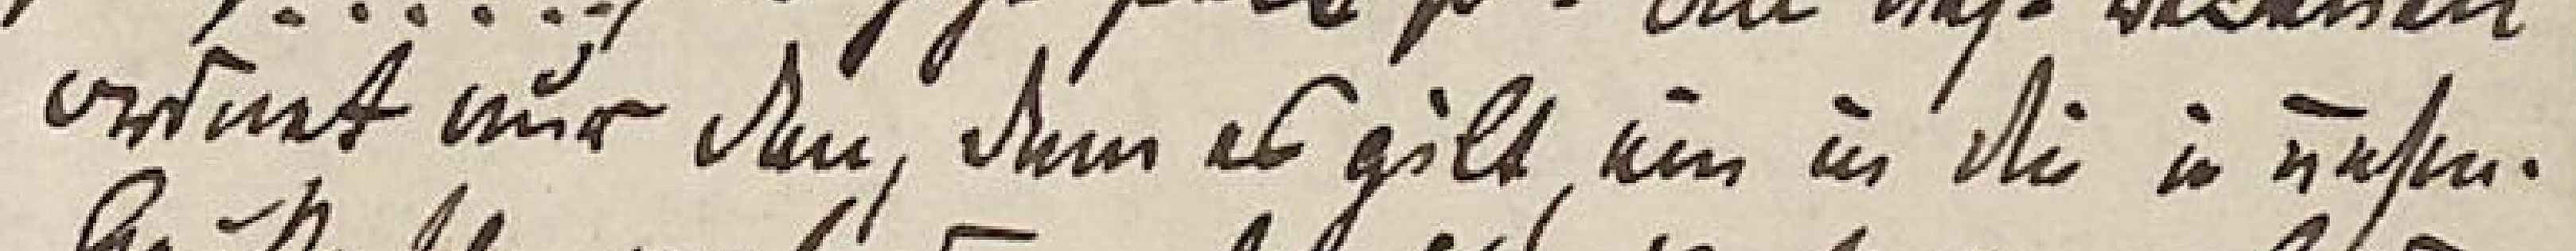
ordnet nur dem, dem es gilt, ein in die in unsm.
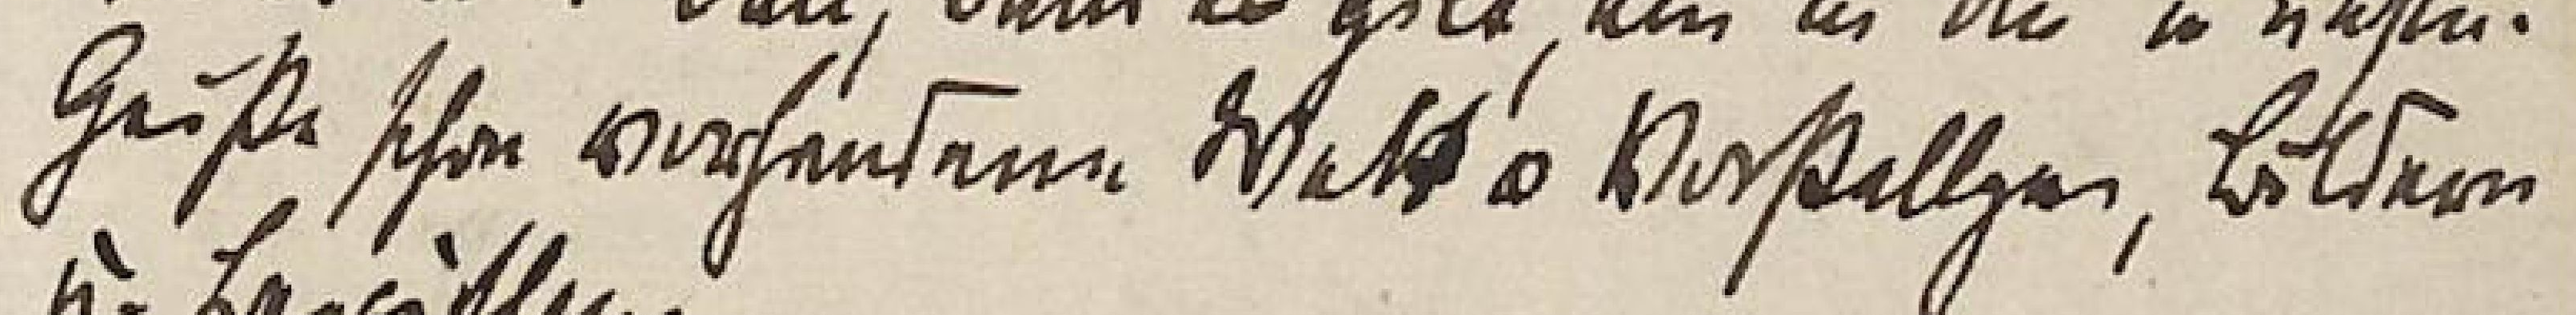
Geiste schon vorhandene Welt v. Vorstellgen, Bildern
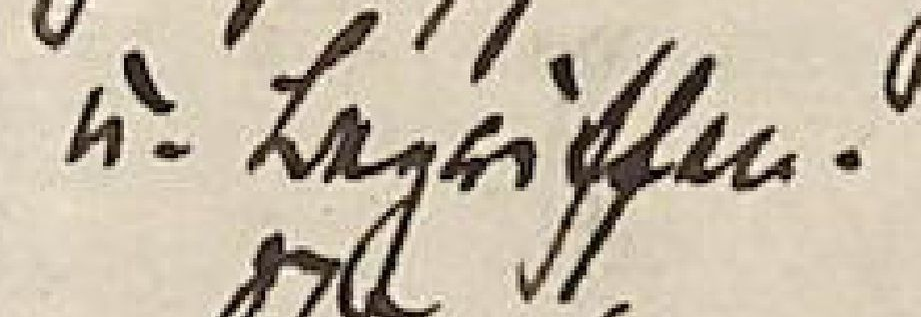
u. Begriffen.
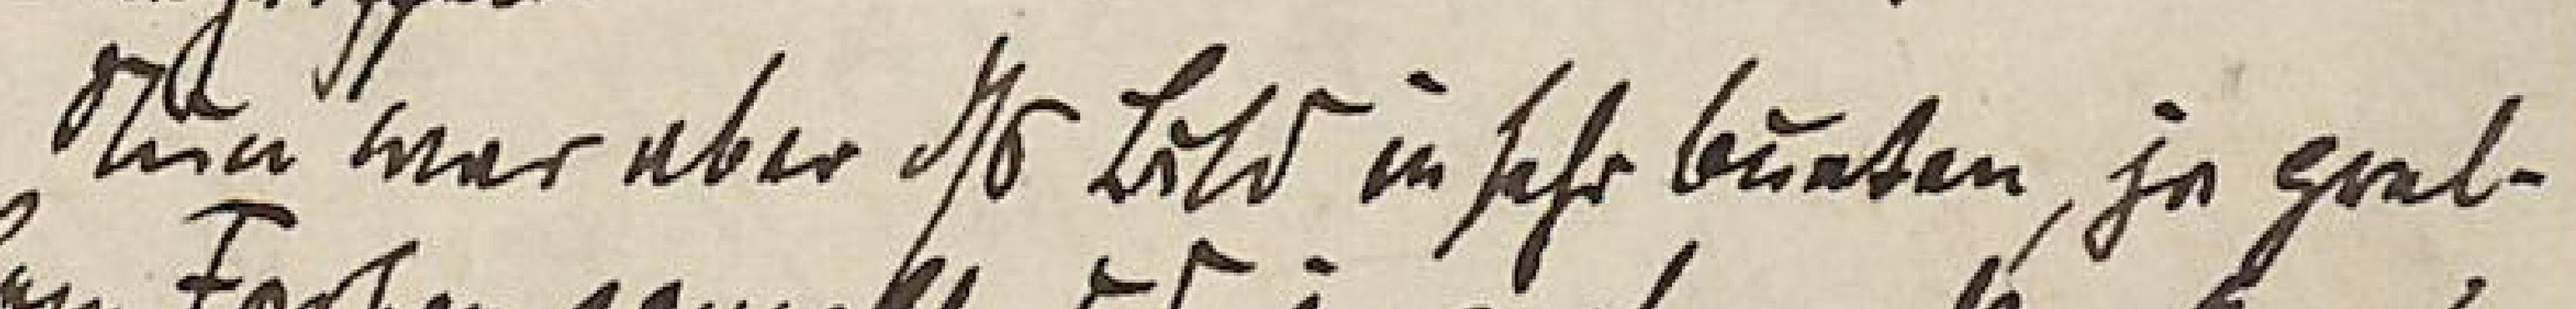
Nun war aber dss Bild in sher bunten, ja grel¬
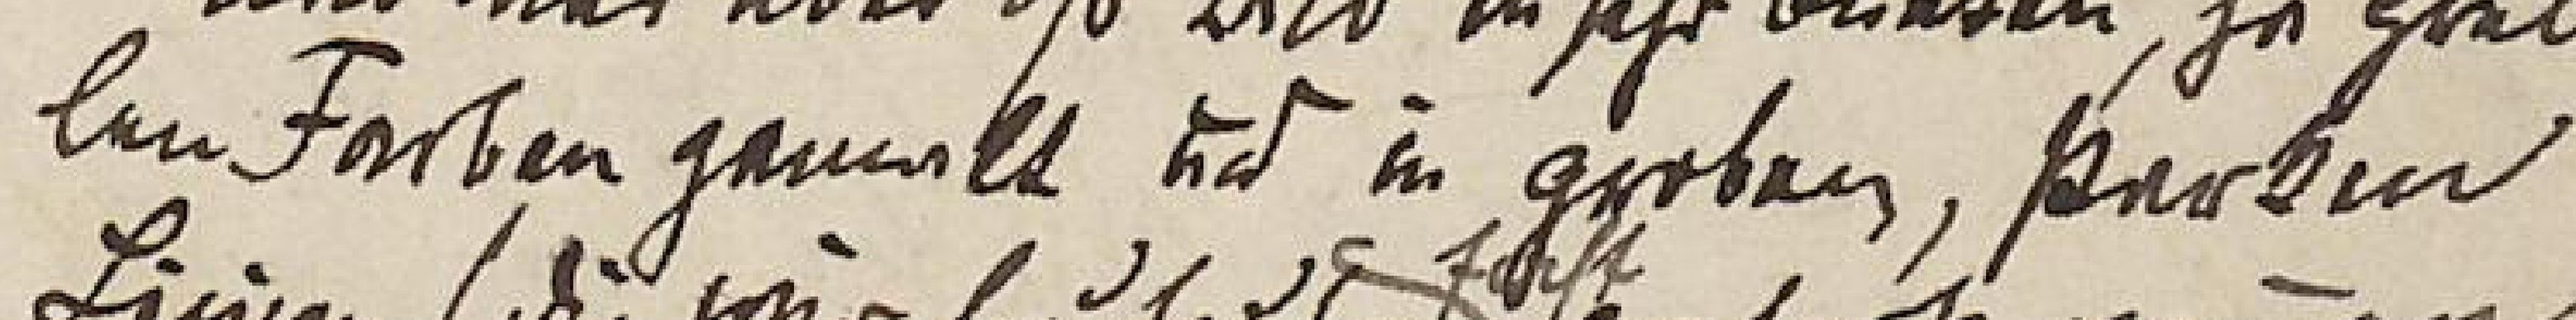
len Farben gemalt und in groben, starken
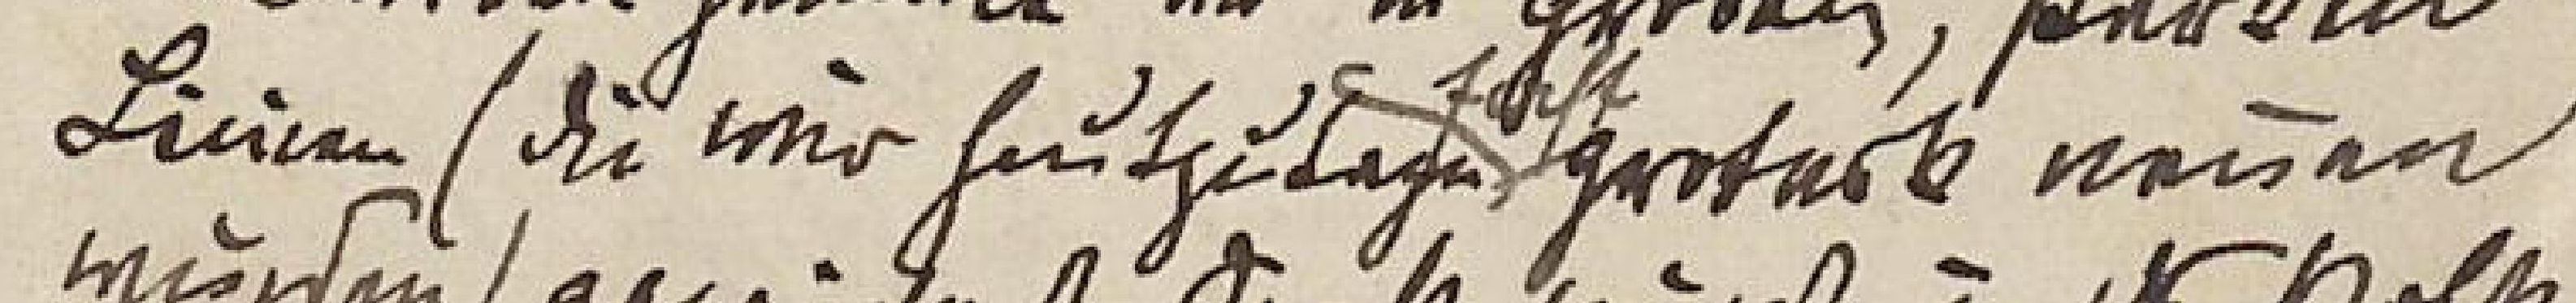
Linien (die wir heutzutage grotesk nenen
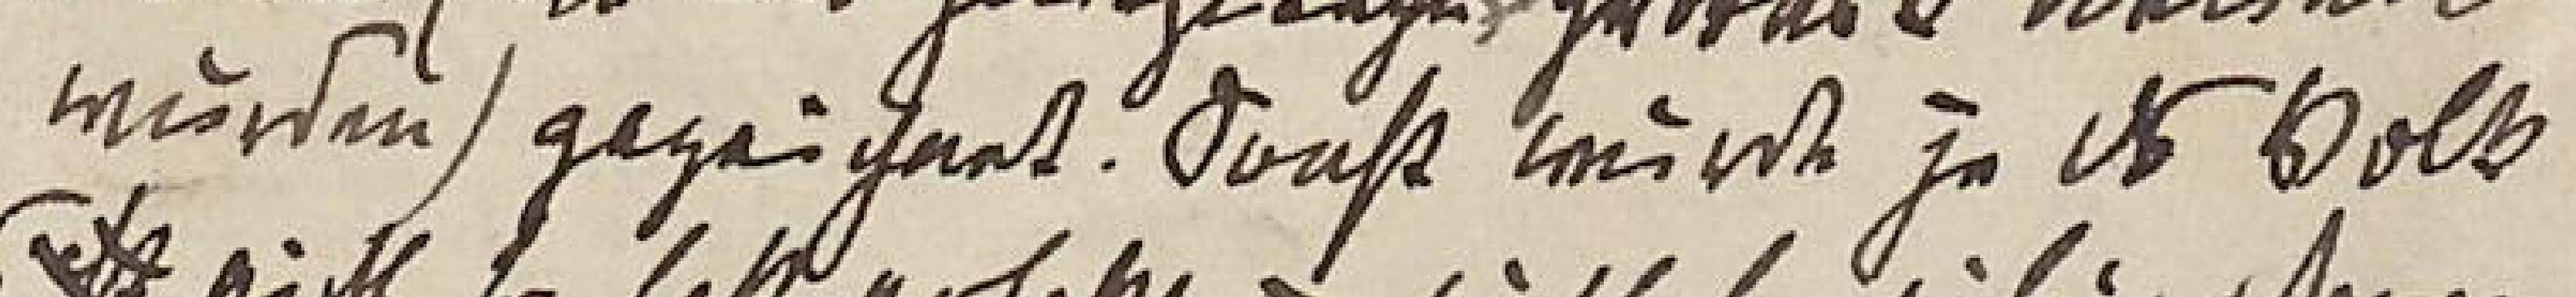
würden) gezeichnet. Sonst würde ja ds Volk
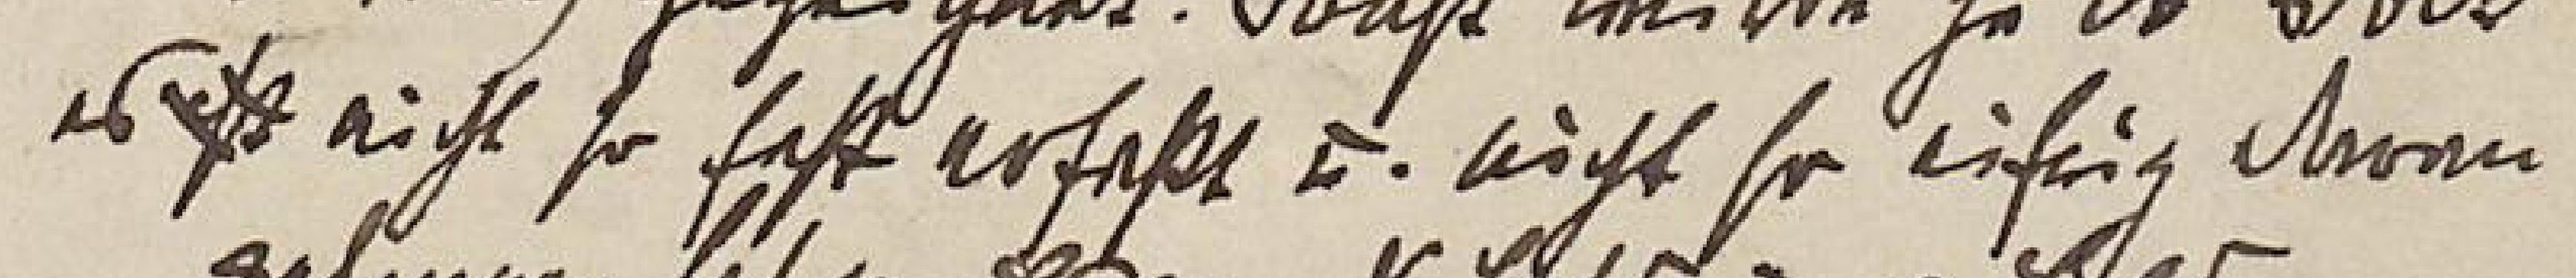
es ist nicht so fest erfaßt u. nicht so eifrig daran
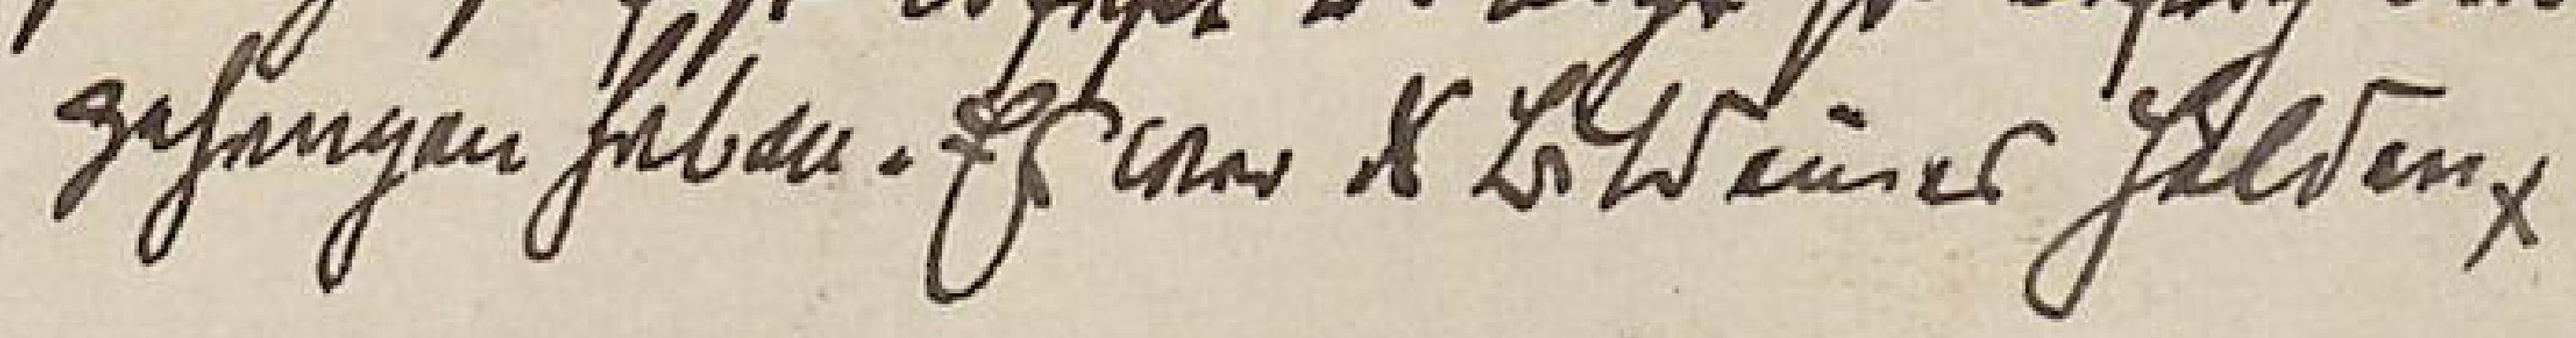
gehanden haben. Es war ds Bild eines Helden,
